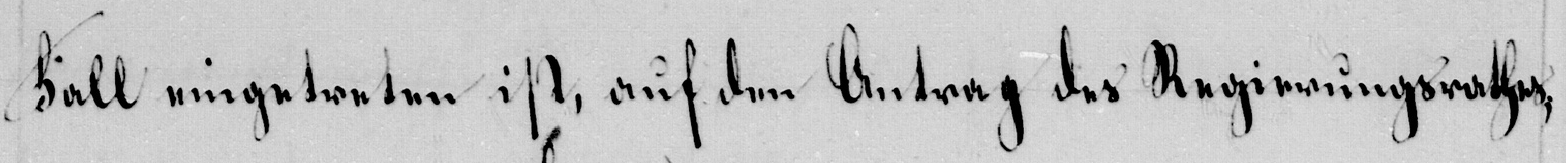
Fall eingetreten ist, auf den Antrag des Regierungsrathes
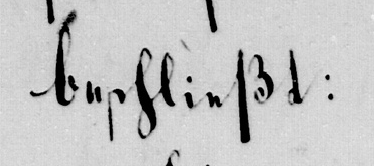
beschließt:
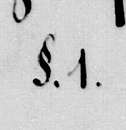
§. 1.
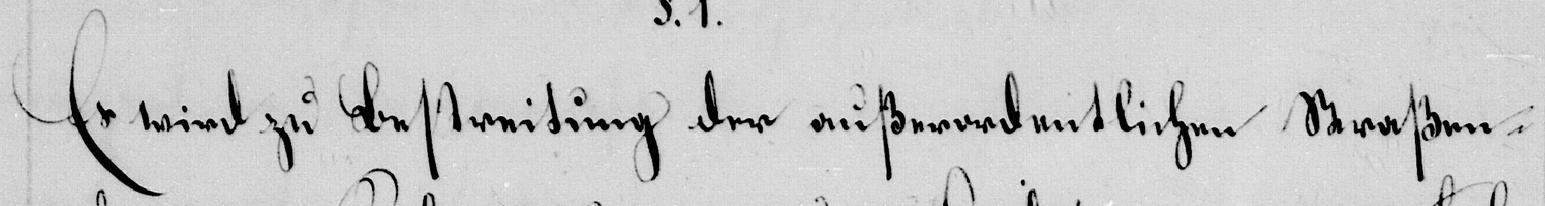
Es wird zu Bestreitung der außerordentlichen Straßen¬
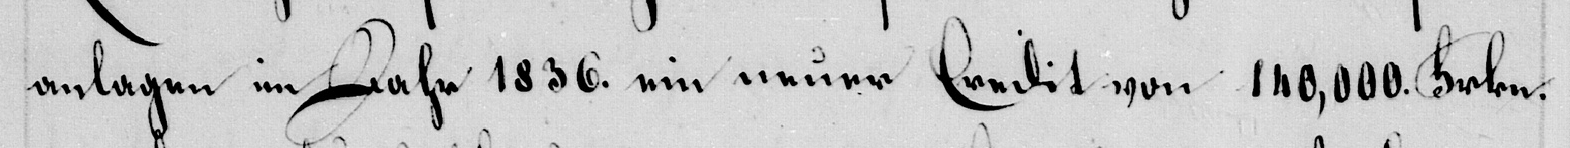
anlagen im Jahre 1836. ein neuer Credit von 140,000. Frkn.
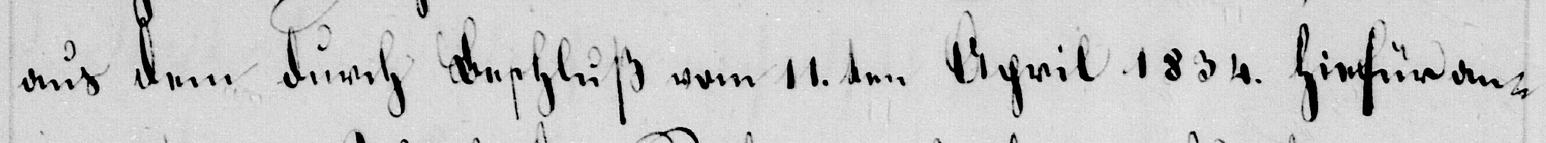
aus dem durch Beschluß vom 11.ten April 1834. hierfür an¬
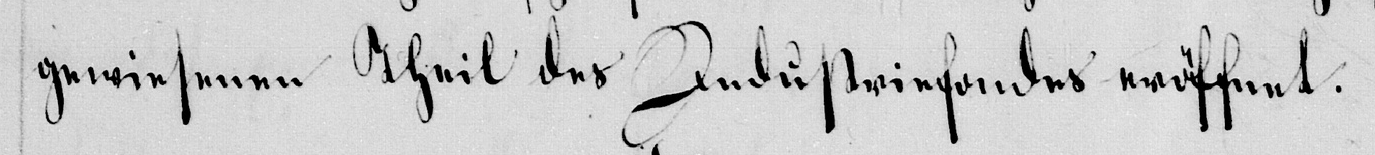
gewiesenen Theil des Industriefondes eröffnet.
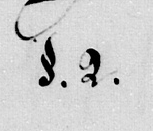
§. 2.
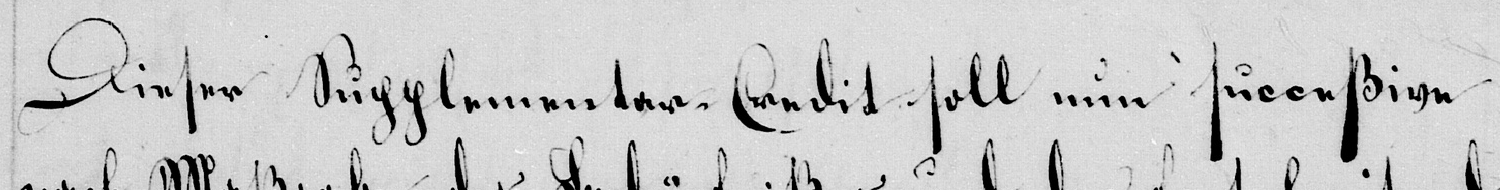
Dieser Supplementar-Credit soll nun succeßive
